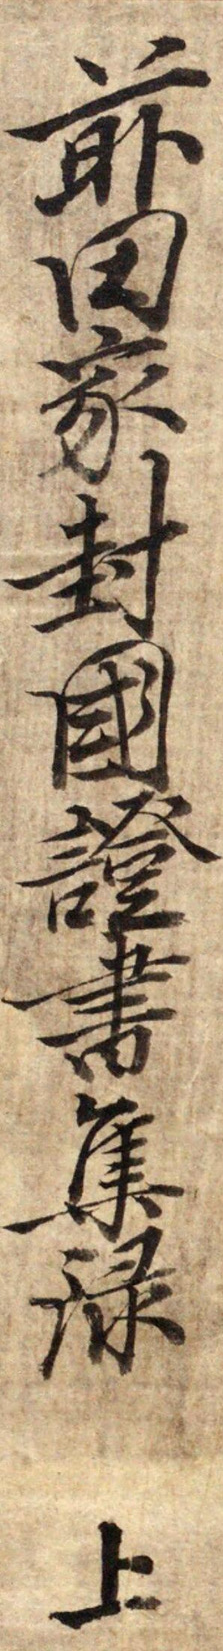前田家封国證書集録上

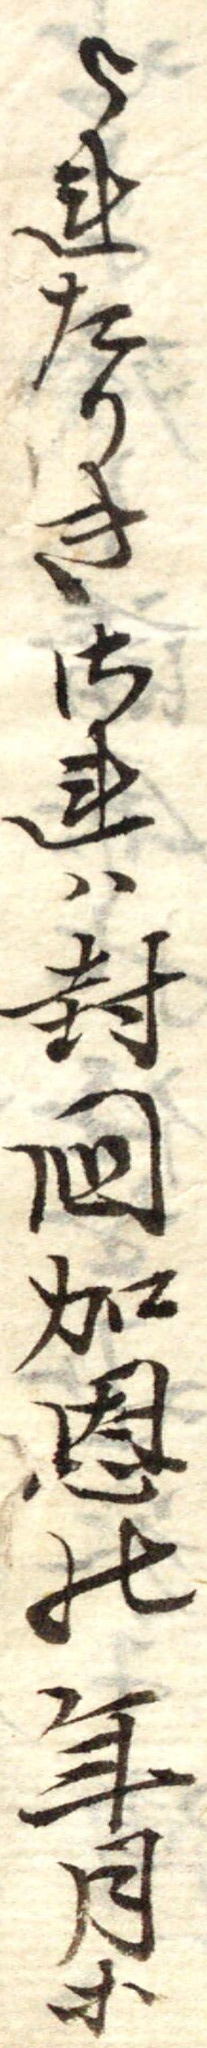ら連たりき御連は封国加恩能年月等
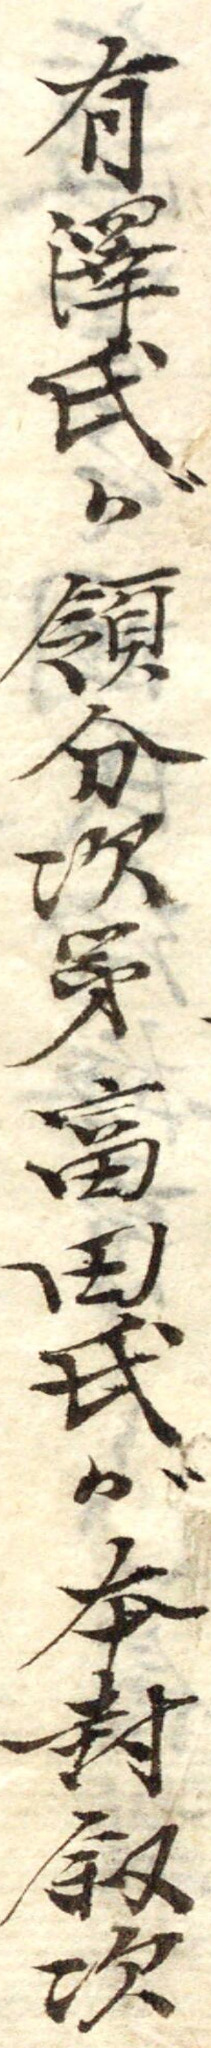有澤氏が領分次第富田氏が本封叙次
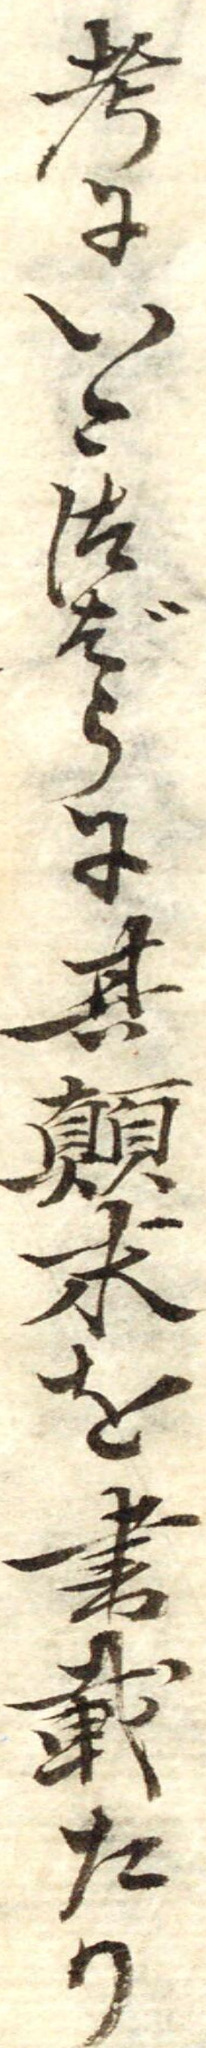考尓いと佐ばら尓其顛末を書載たり
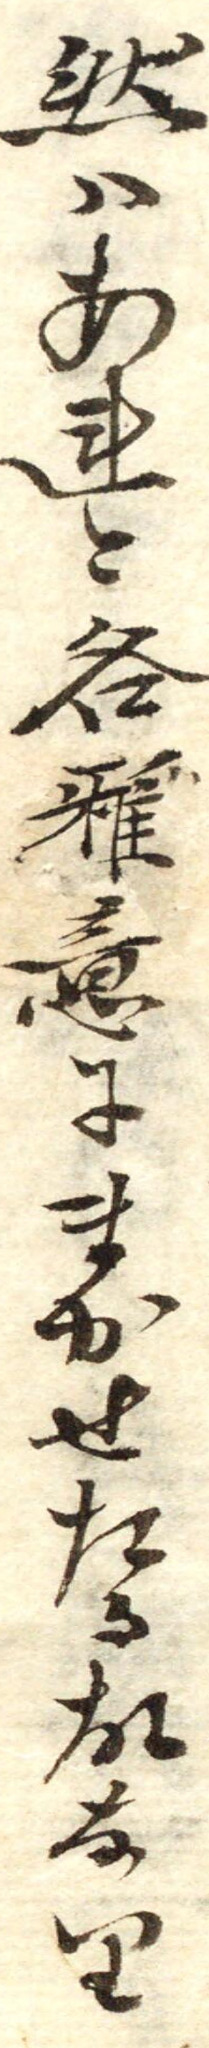然はあ連と各雅意尓まかせたる故な里
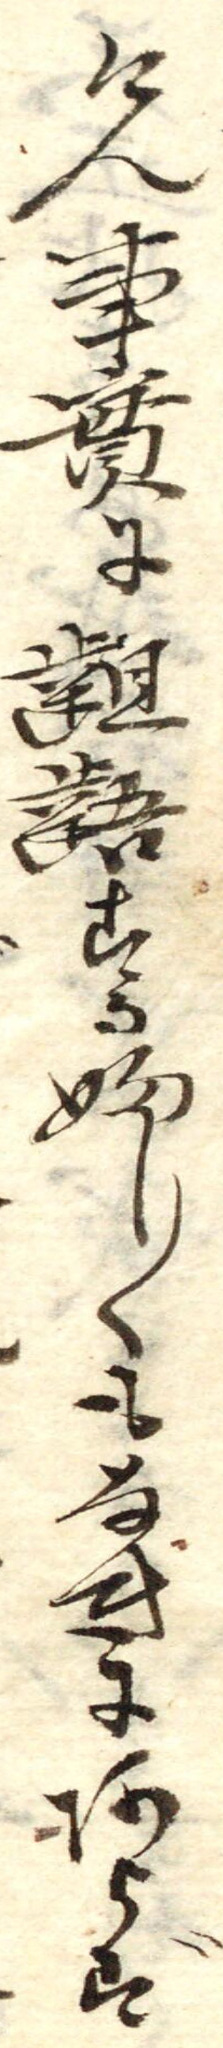けん事実尓齟齬春る婦し〳〵もなき尓阿ら春
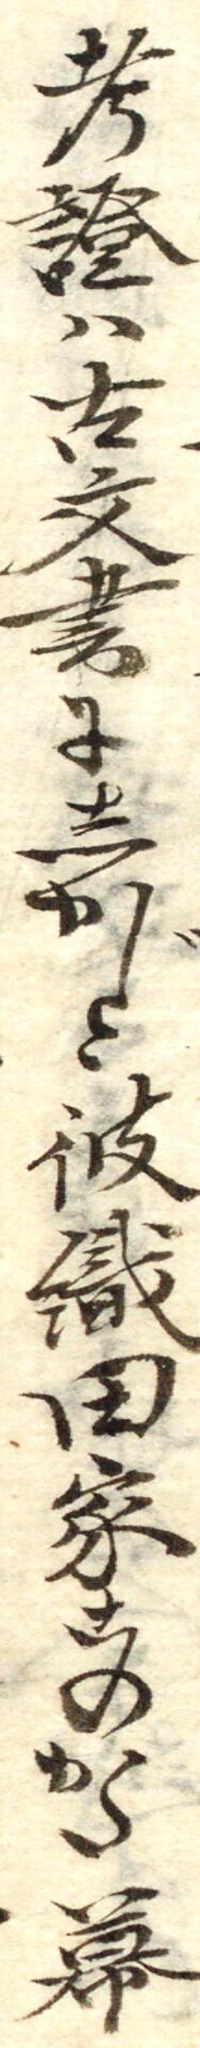考證は古文書尓志かじと彼織田家このかた幕
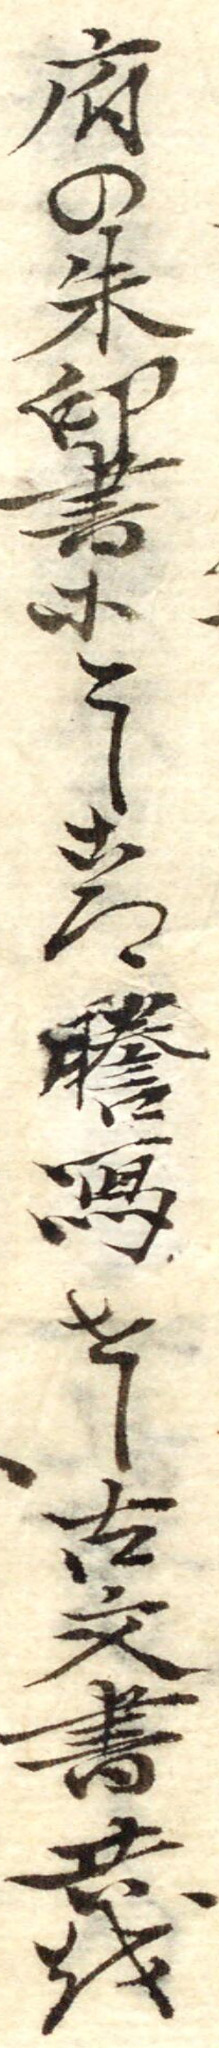府の朱印書等としころ謄写をし古文書共越
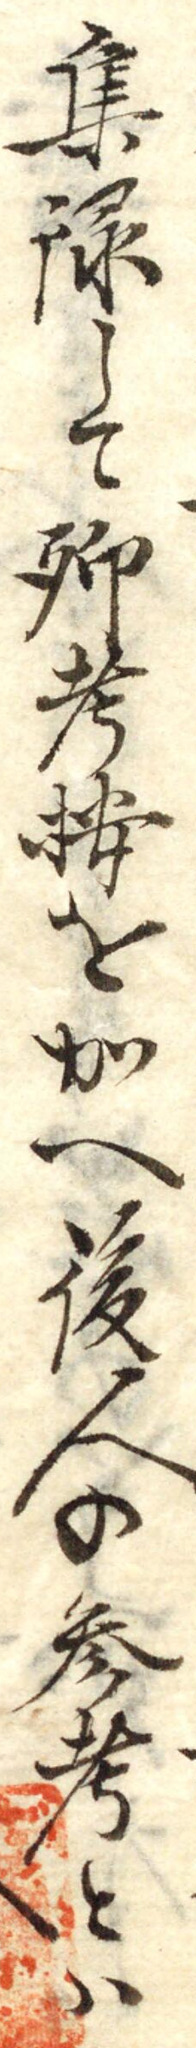集録して聊考按を加へ後人の参考とは
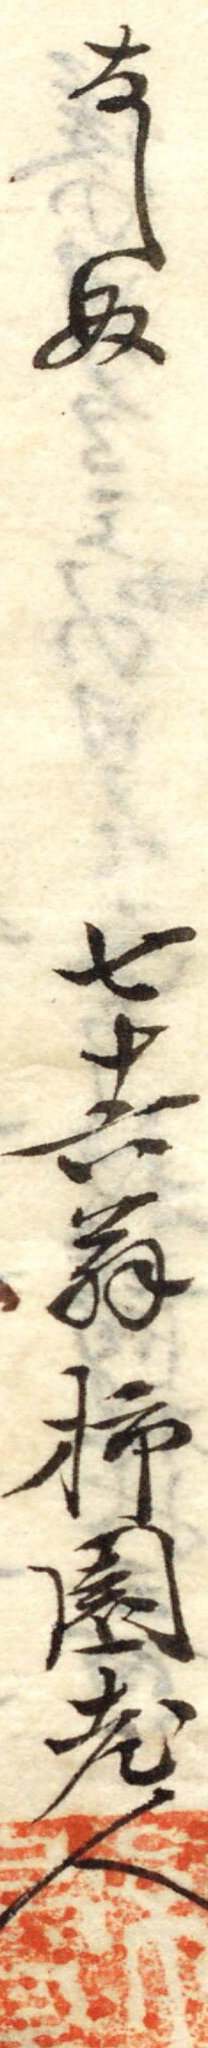なしぬ七十六翁柿園老人
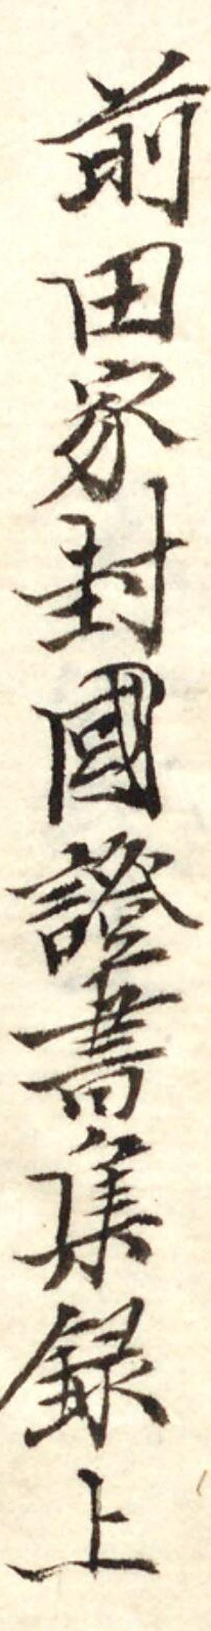前田家封国證書集録上
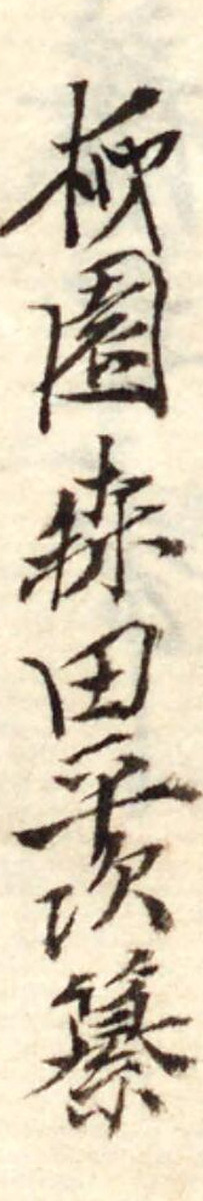柳園桑田平治纂
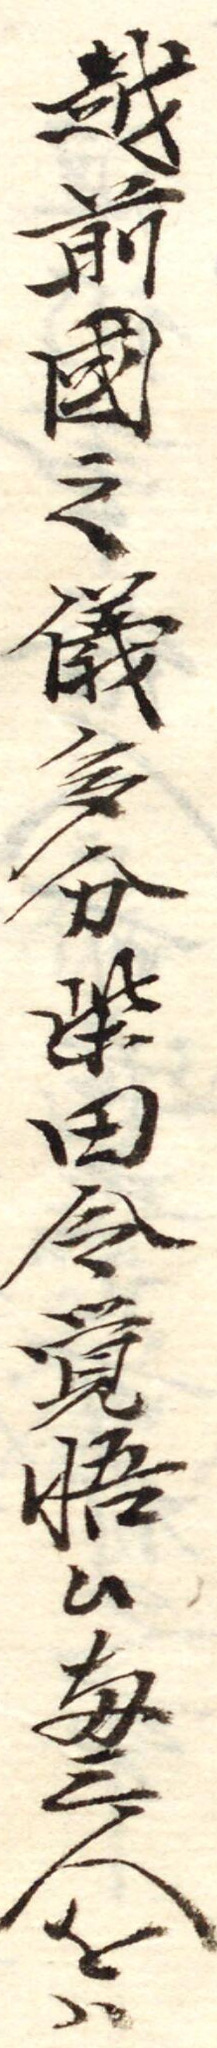越前国之儀多分柴田令覚悟候両三人をは
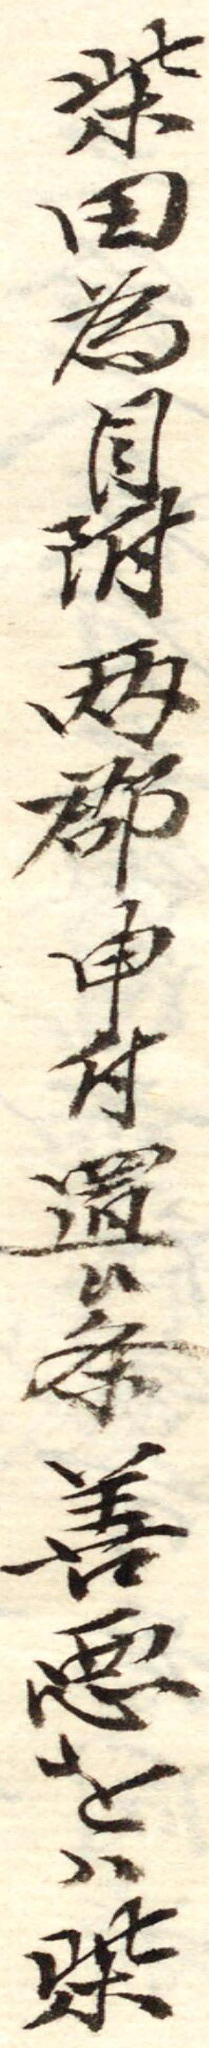柴田為目附両軍申付置候条善悪をは柴
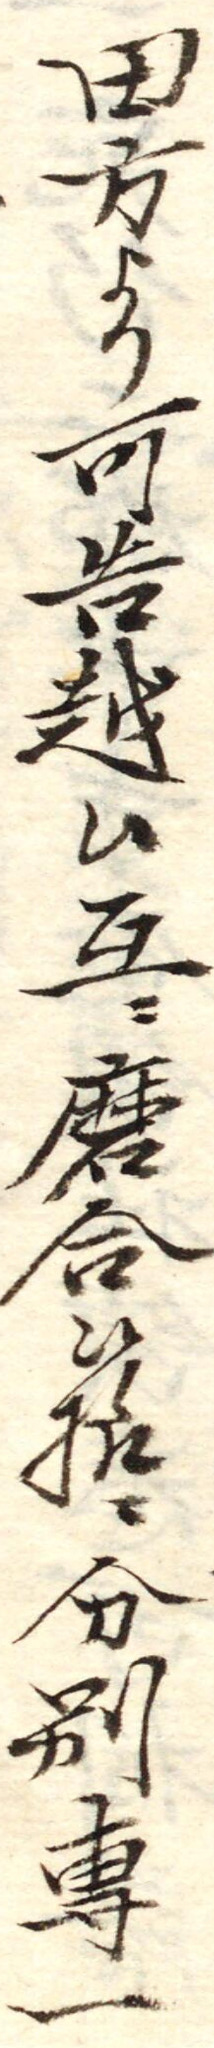田方より可告越候互に磨合候様に分別専一
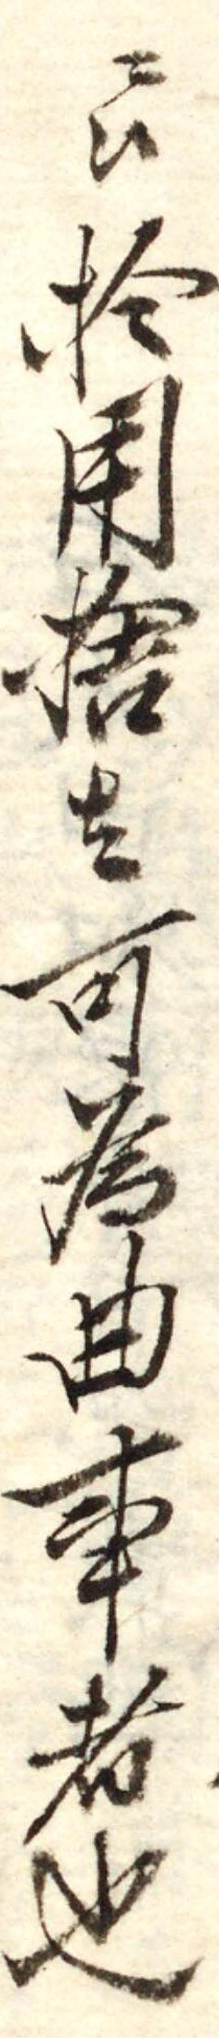に候拾用捨は可為曲事者也
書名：前田家封国証書集録
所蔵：Ishikawa Prefectural Library
